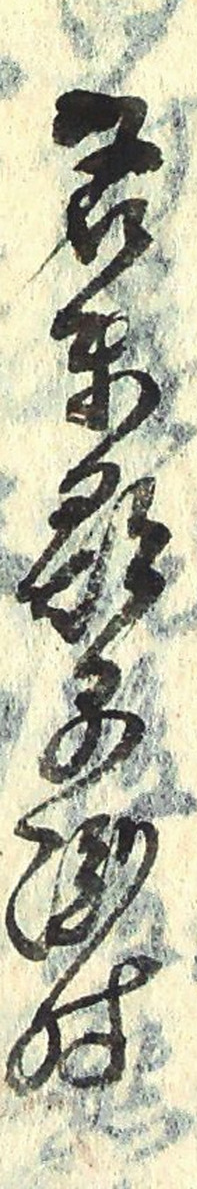名東郡早淵村
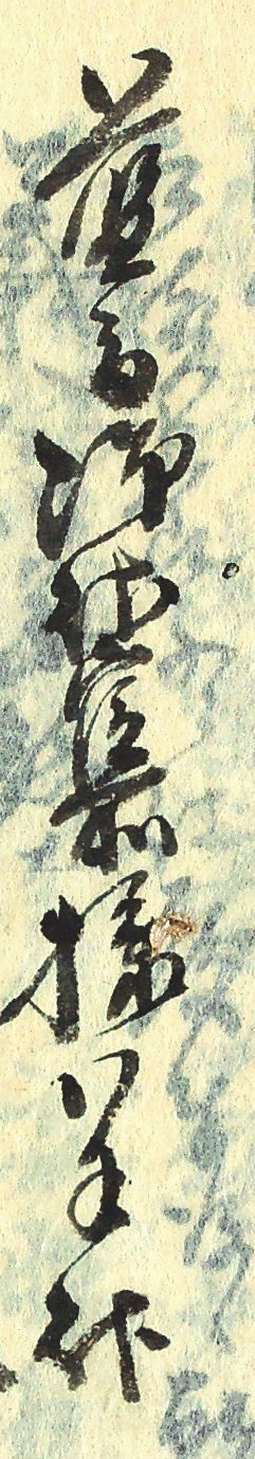藍方御代官所様御手代
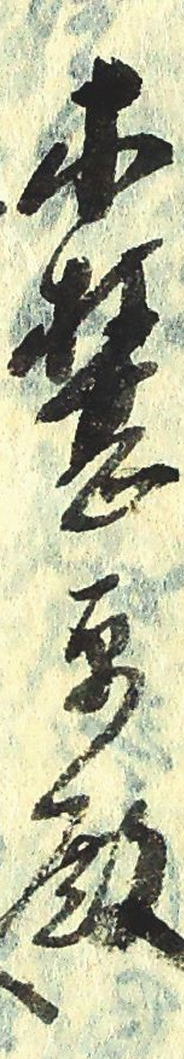木村甚平殿
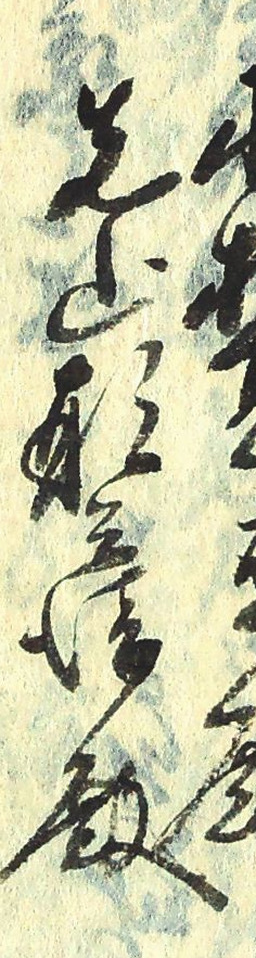先山形兵衛殿
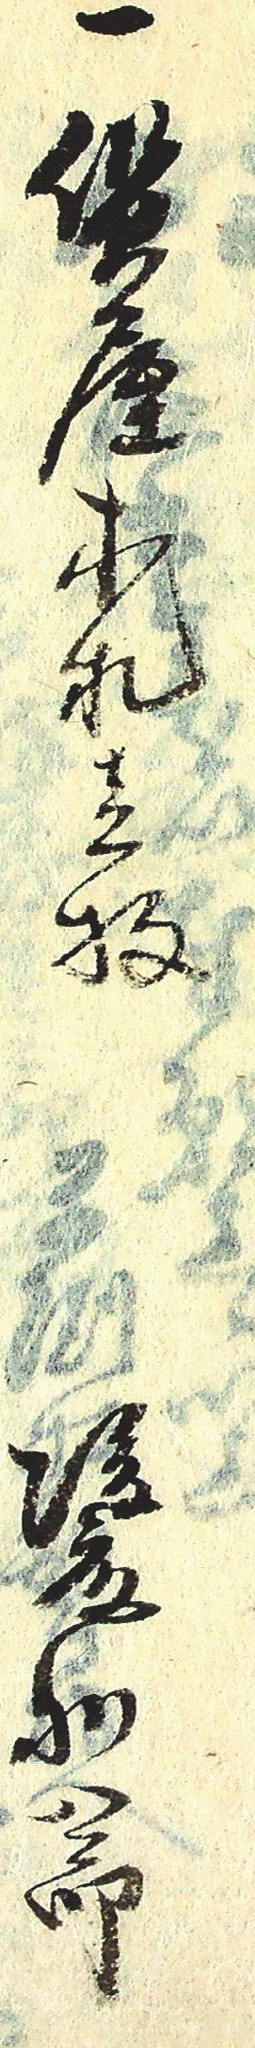一質屋木札壱枚後藤利八郎
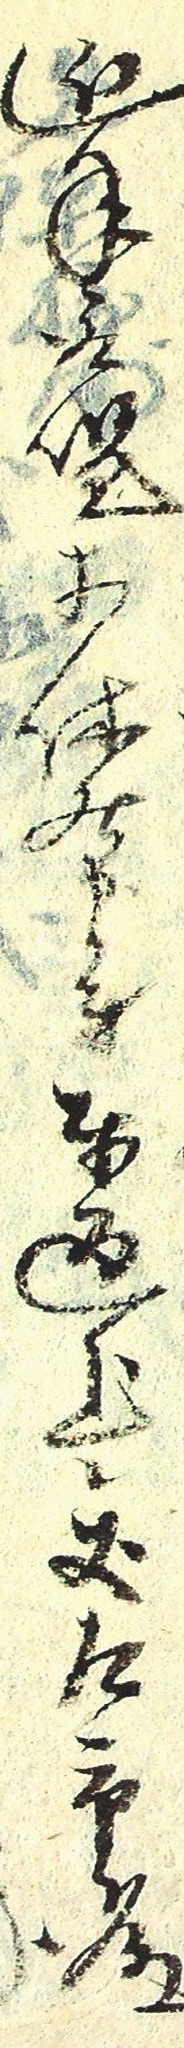近年取質相休居申候付奉返上候使左市郎殿
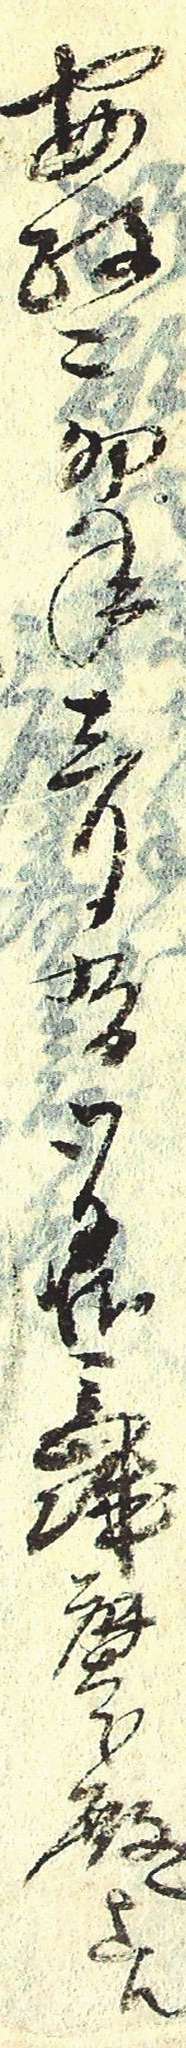安政二卯年十二月九日御手代宮城麻太郎殿へ上る
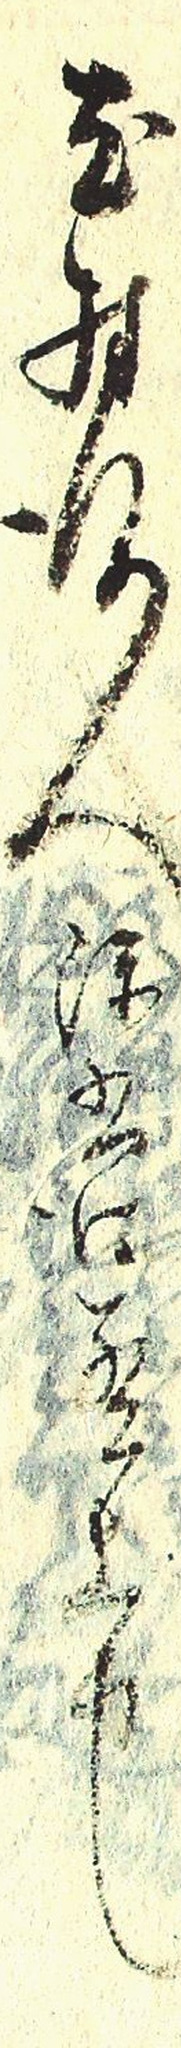尤村役人添書仕差上申候

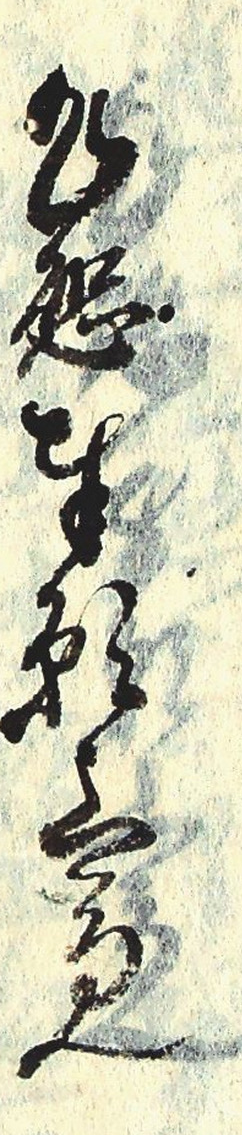乍恐奉願上覚
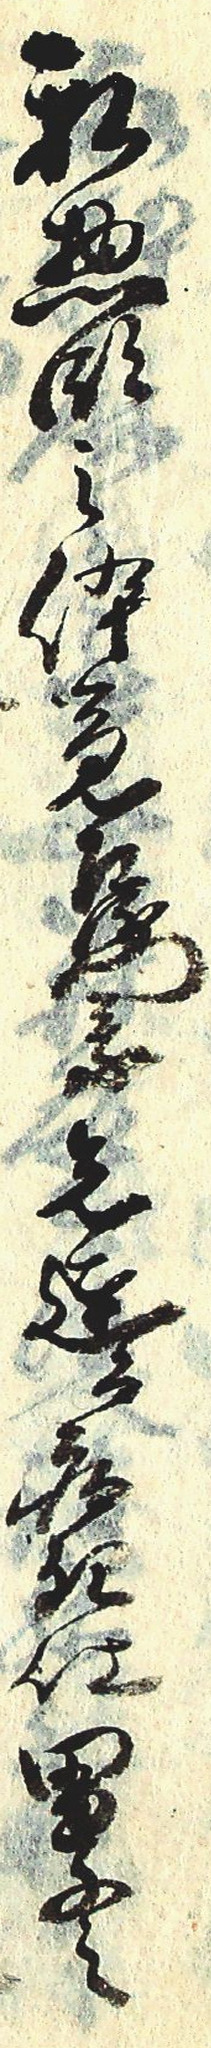私惣領之倅覚左衛門義先達て病死仕男子之
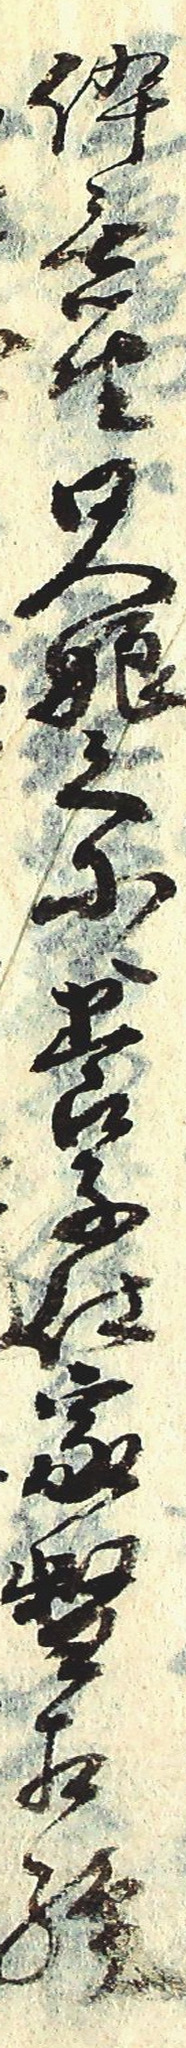倅無御座同人娘くにへ養子仕家督相続
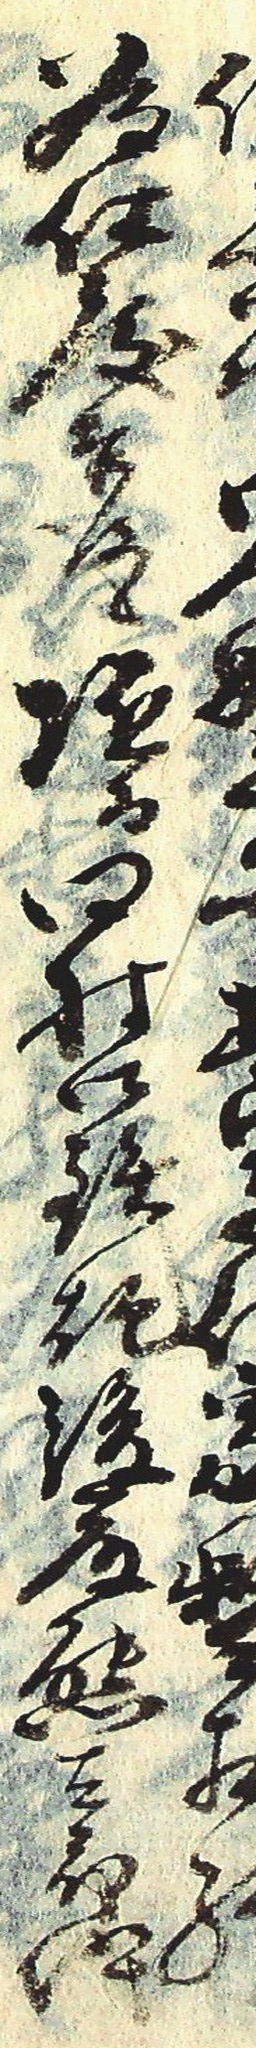為仕度奉存候随て同村郷鉄炮後藤熊太郎倅
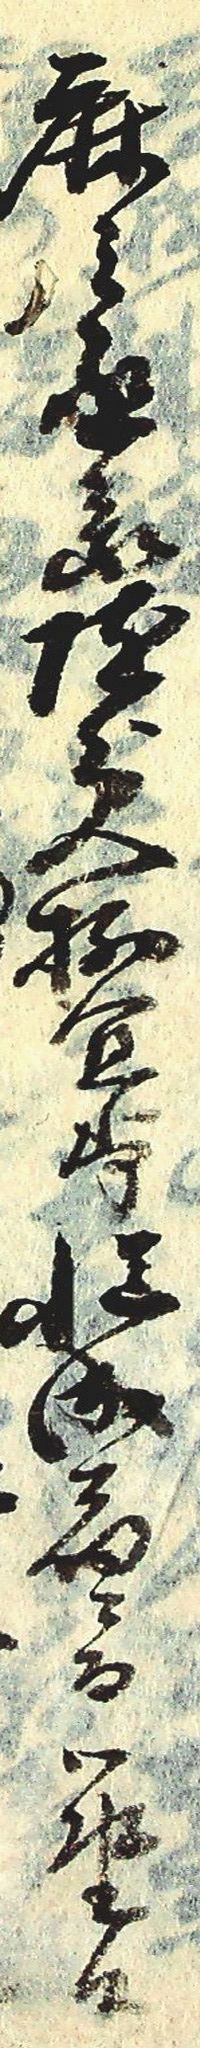麻之丞義随分人柄宜布慥成者にて御座候
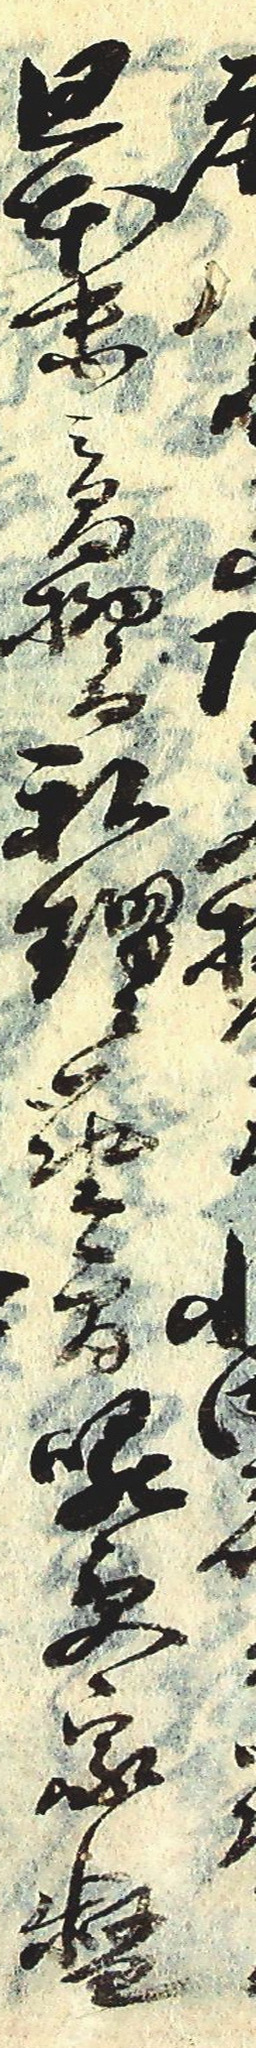且本末之間柄にて私甥に御座候間囉受家督
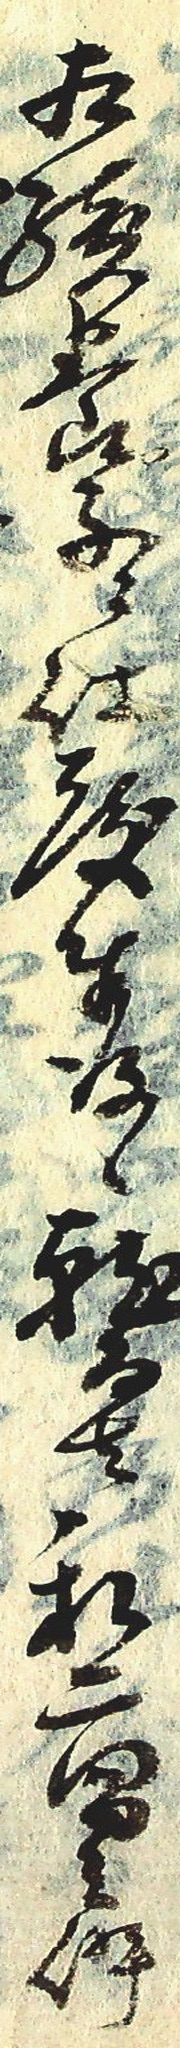相続養子に仕度奉存候就ては私二男之倅
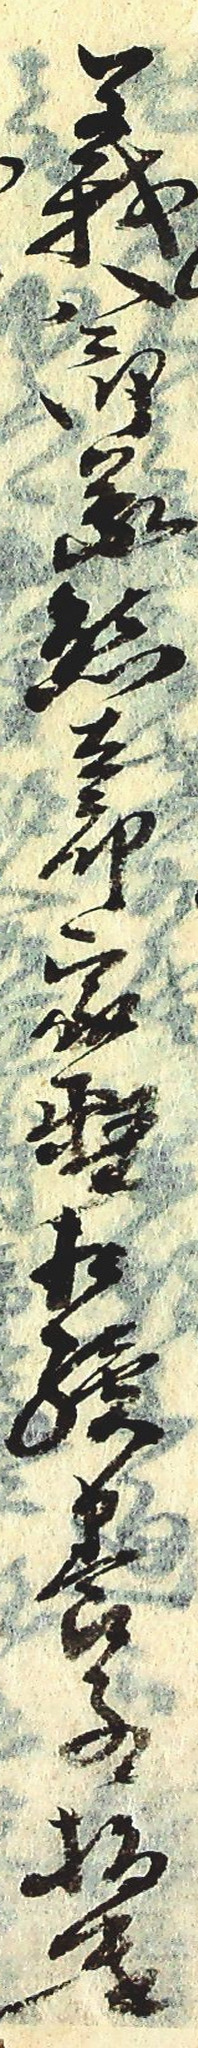義八郎義熊太郎家督相続養子に指遣
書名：諸御願書控(弐番）
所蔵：鳴門教育大学 Naruto University of Education
